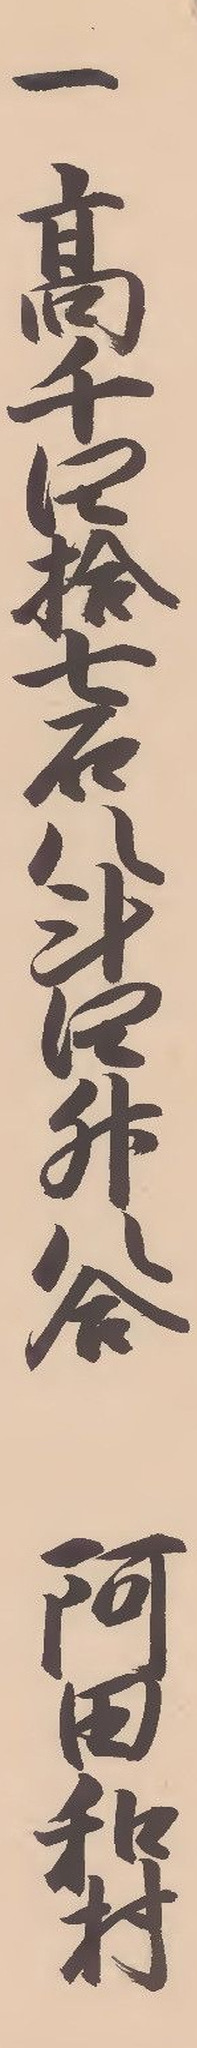一高千四拾七石八斗四升八合阿田和村
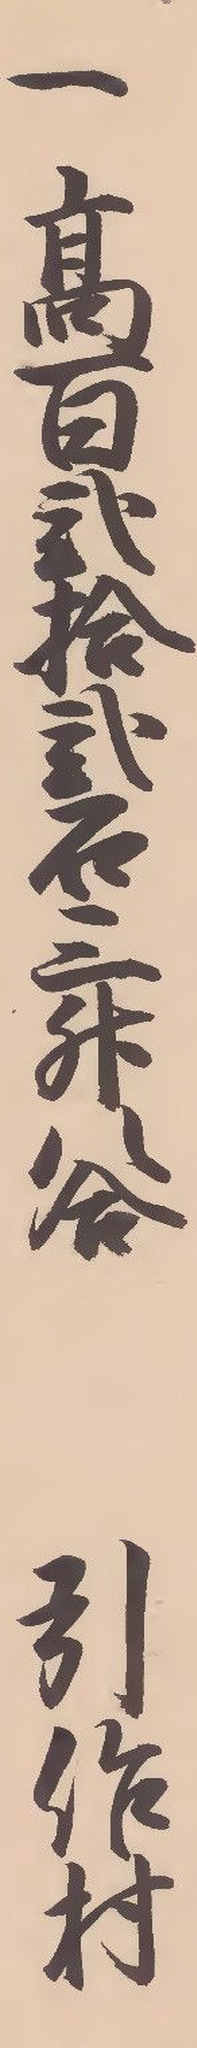一高百弐拾弐石三升八合引作村
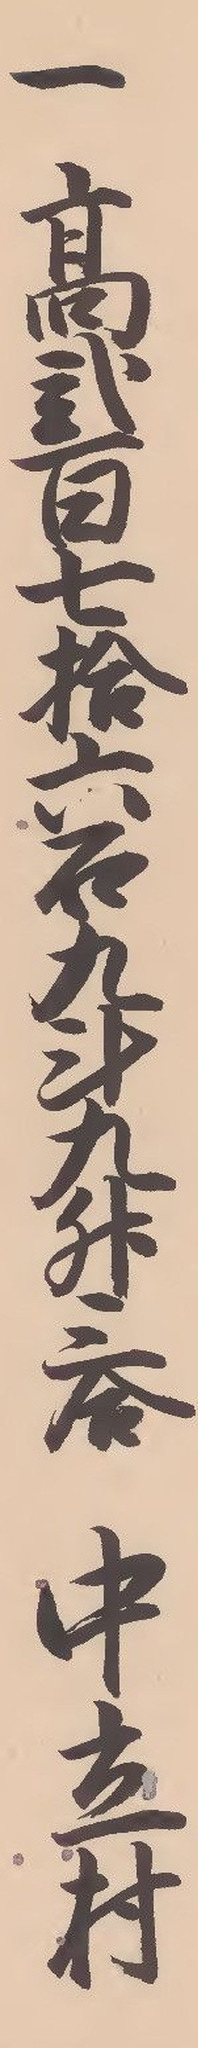一高弐百七拾六石九斗九升三合中立村

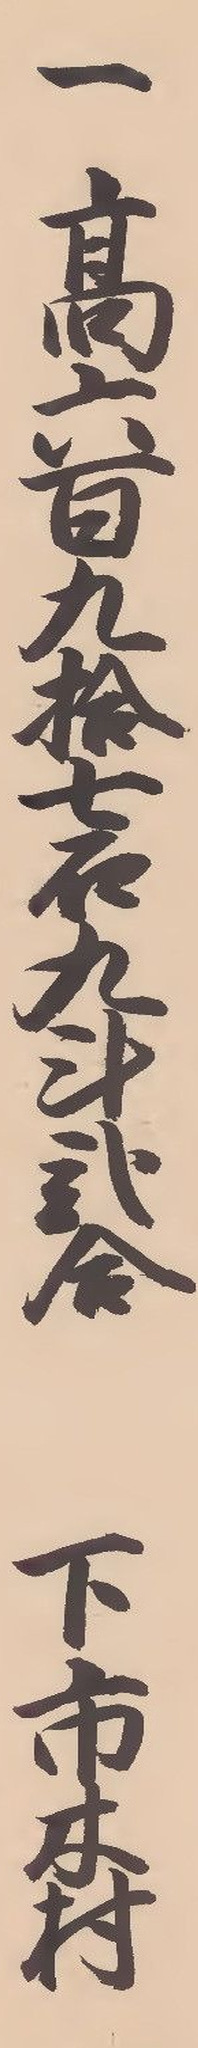一高六百九拾七石九斗弐合下市木村
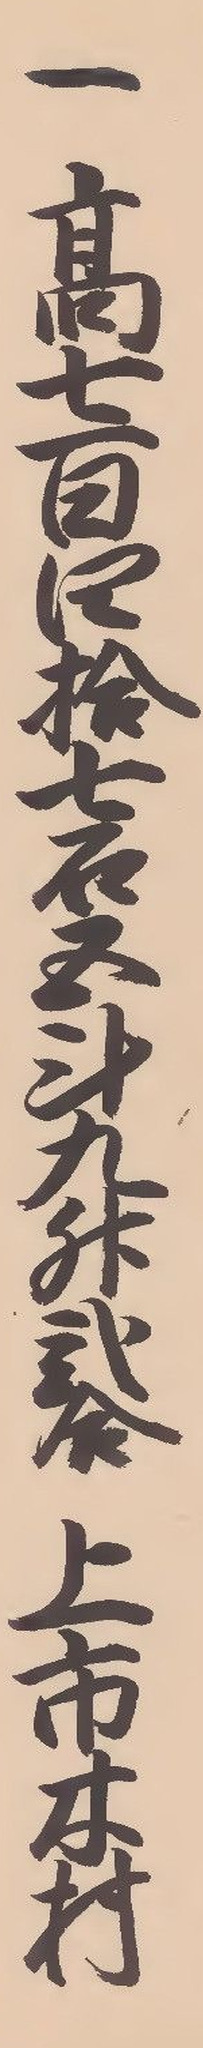一高七百四拾七石五斗九升弐合上市木村
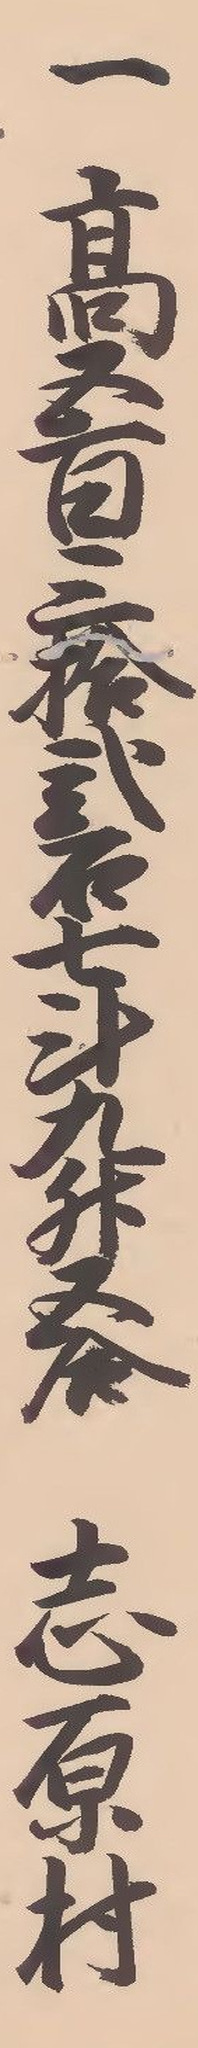一高五百三拾弐石七斗九升五合志原村
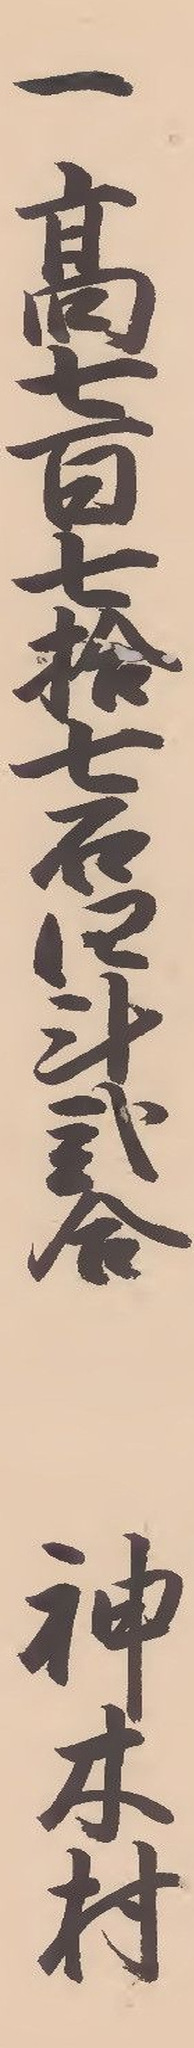一高七百七拾七石四斗弐合神木村
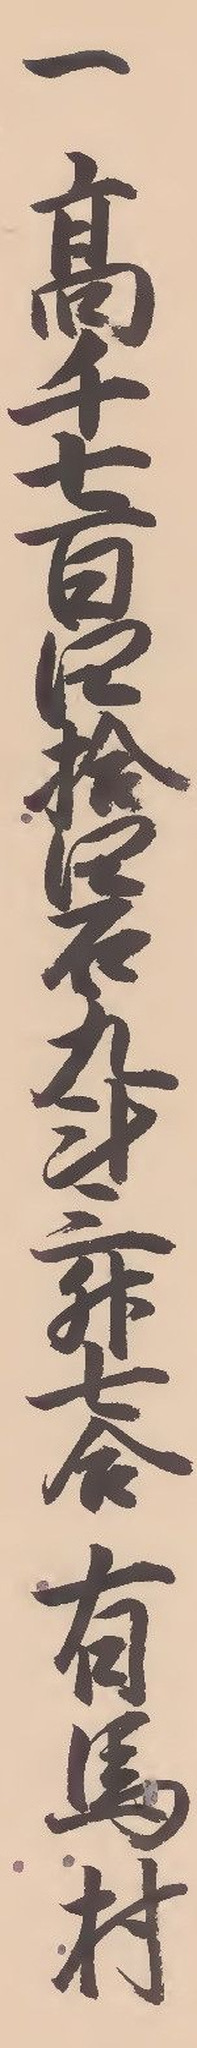一高千七百四拾四石九斗三升七合有馬村

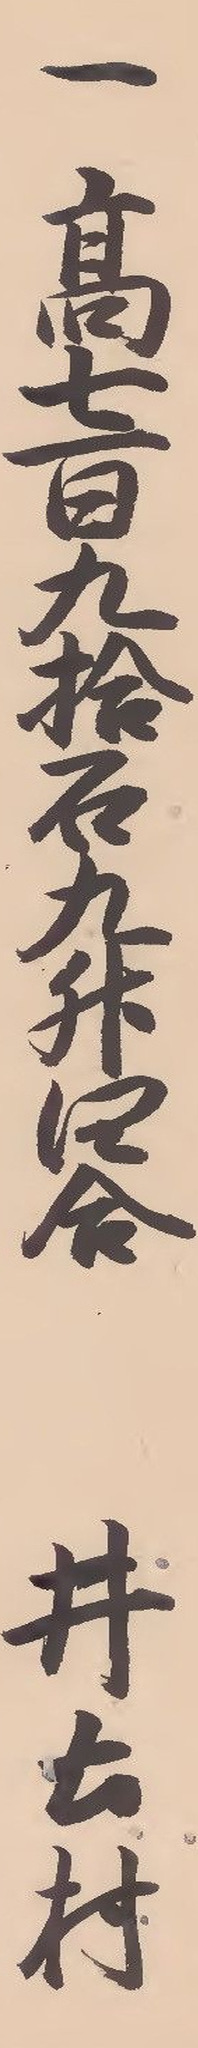一高七百九拾石九升四合井土村
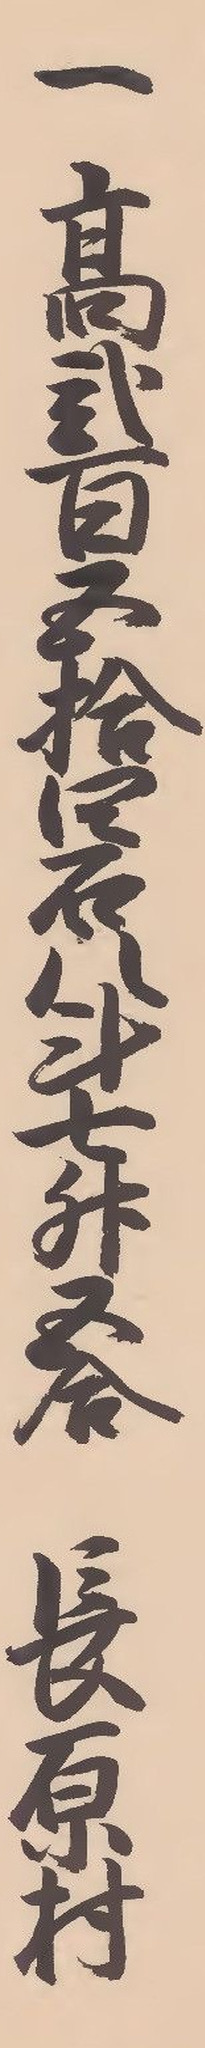一高弐百五拾四石八斗七升五合長原村
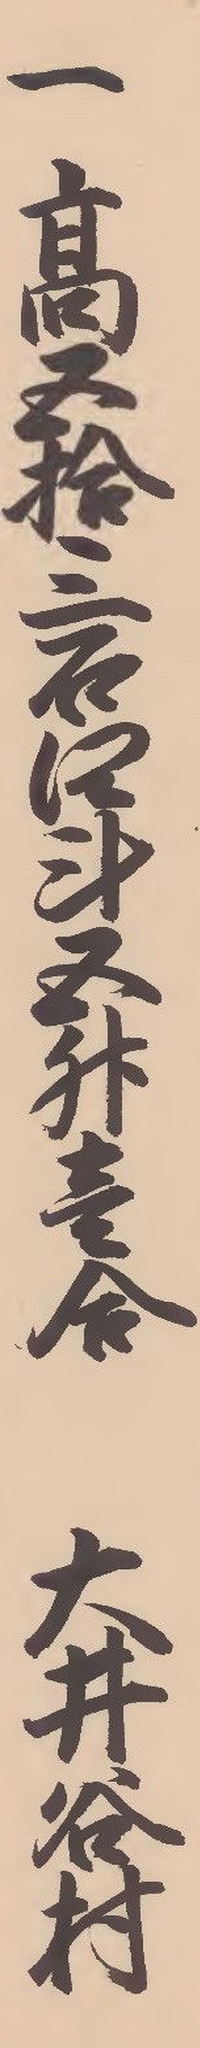一高五拾三石四斗五升壱合大井谷村

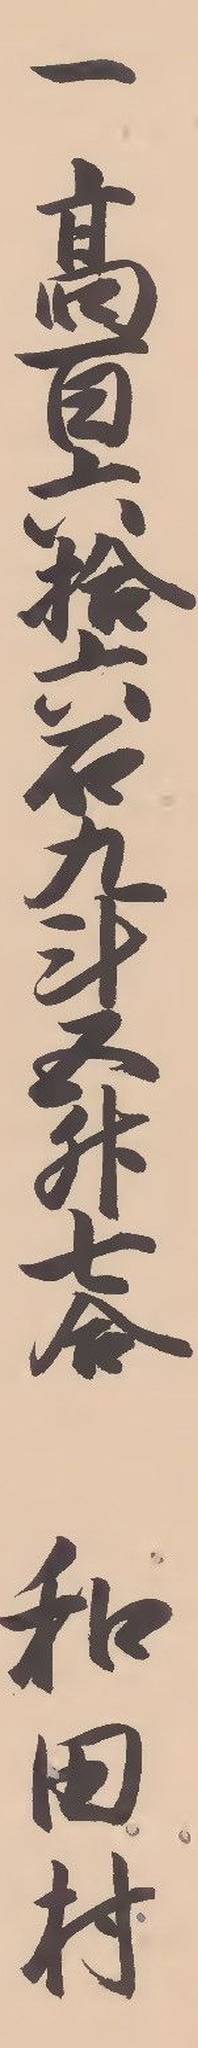一高百六拾六石九斗五升七合和田村
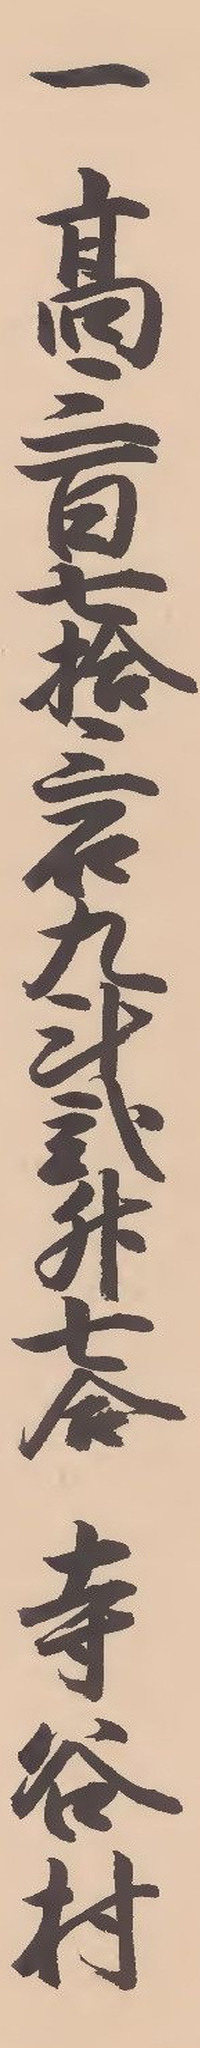一高三百七拾三石九斗弐升七合寺谷村
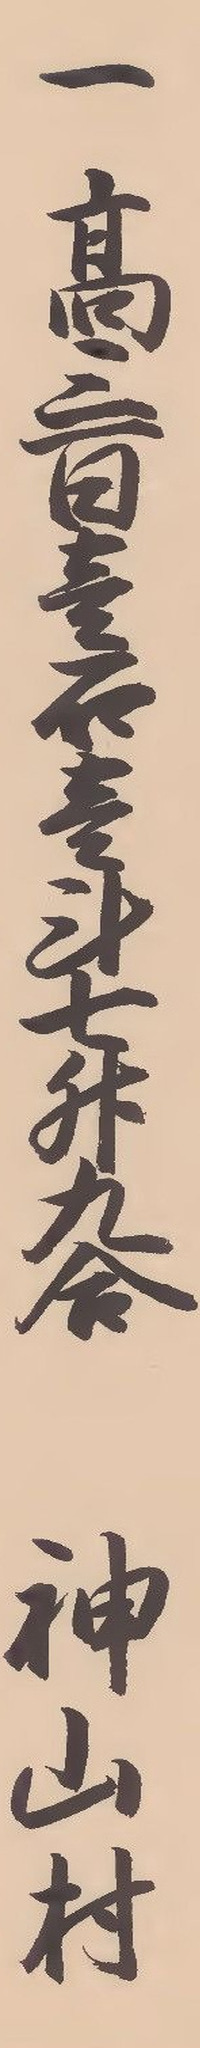一高三百壱石壱斗七升九合神山村
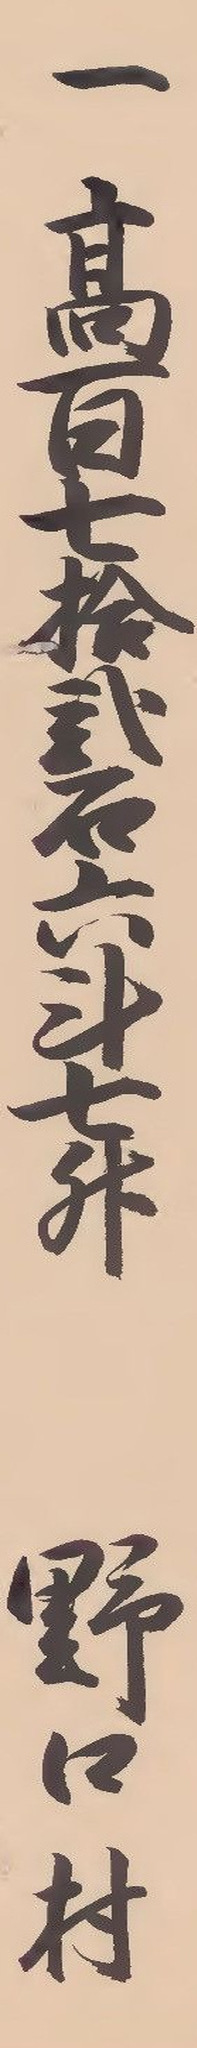一高百七拾弐石六斗七升野口村
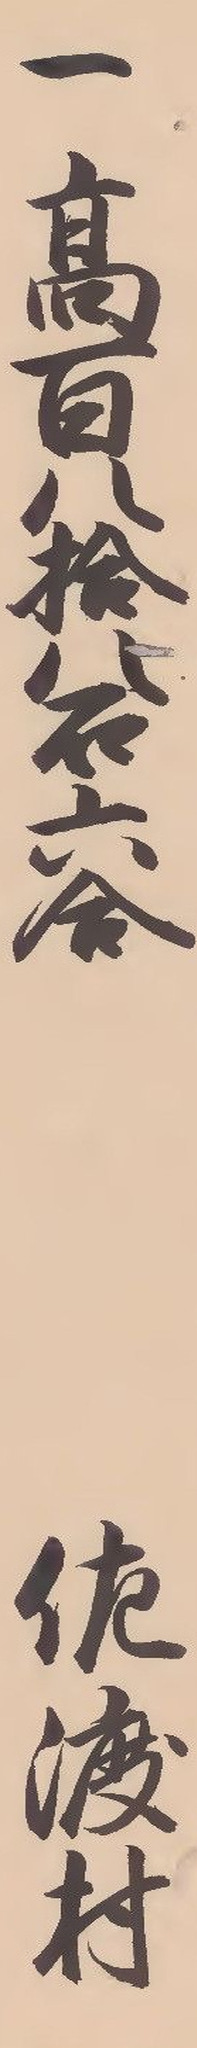一高百八拾八石六合佐渡村
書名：紀伊国郷帳
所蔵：国立公文書館 National Archives of Japan
